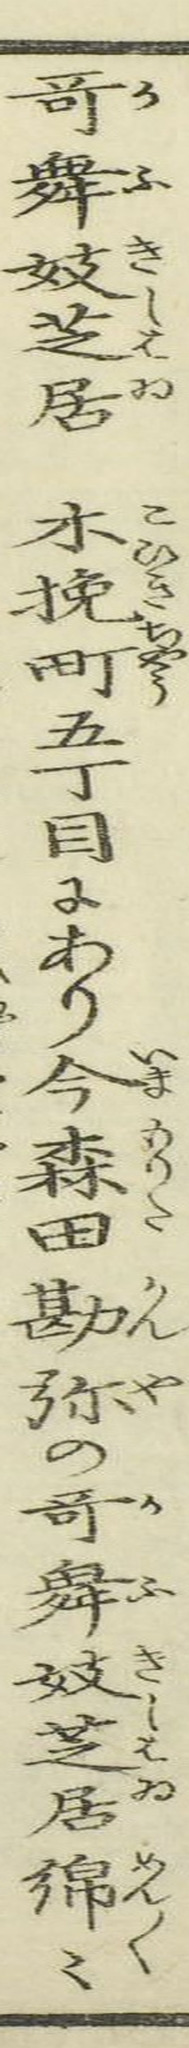哥舞妓芝居木挽町五丁目にあり今森田勘弥の哥舞妓芝居綿々
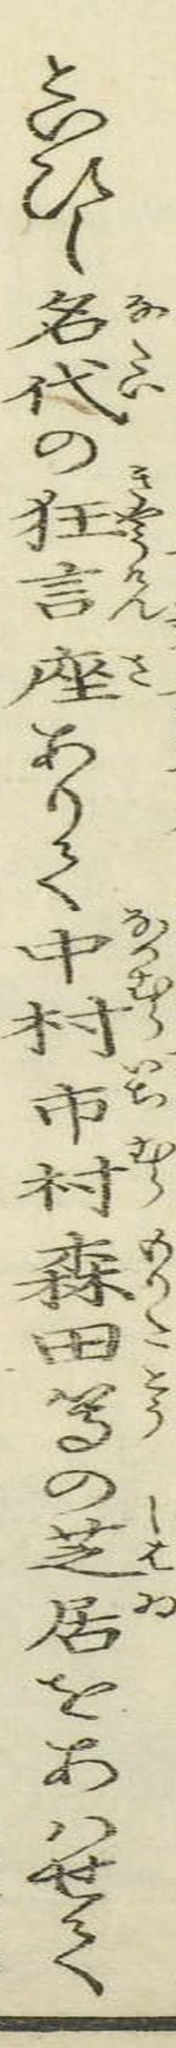といひし名代の狂言座ありて中村市村森田等の芝居をあはせて
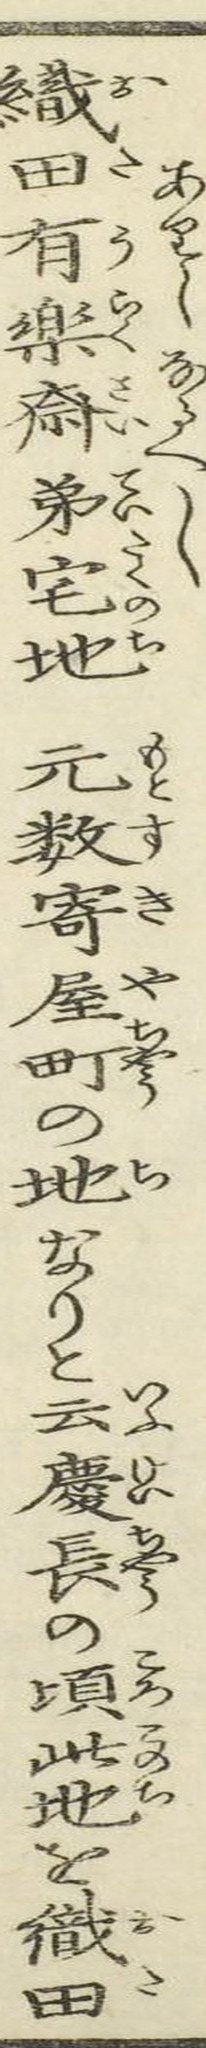織田有楽斎弟宅地元数寄屋町の地なりと云慶長の頃此地を織田
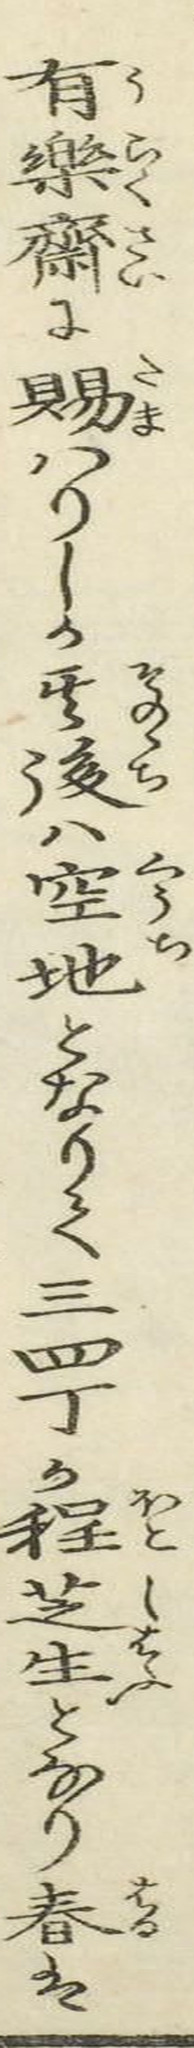有楽斎に賜はりしか其後は空地となりて三四丁か程芝生となり春は
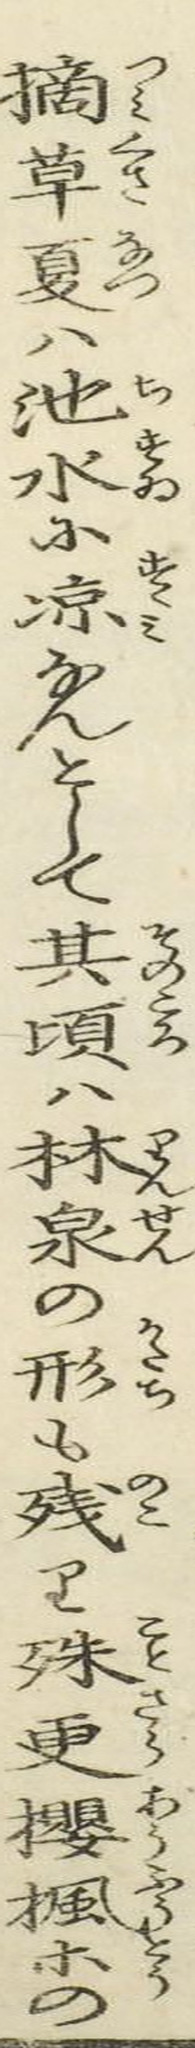摘草夏は池水に涼なんとして其頃は林泉の形も残り殊更櫻楓等の
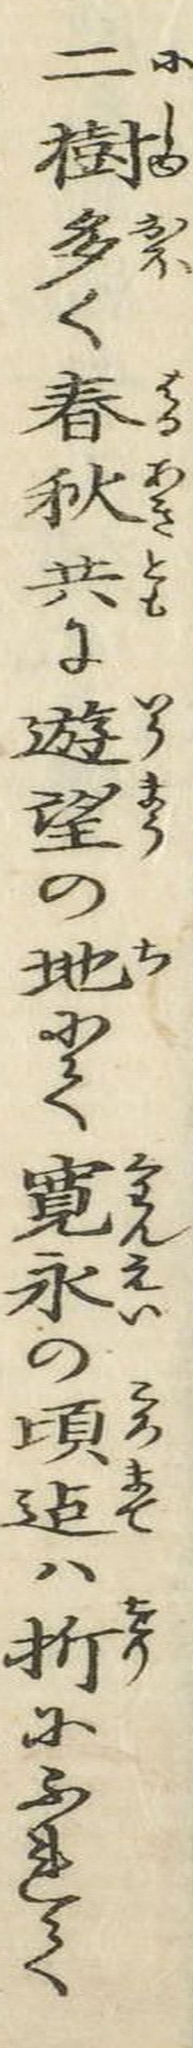二樹多く春秋共に遊望の地にて寛永の頃迄は折にふれて
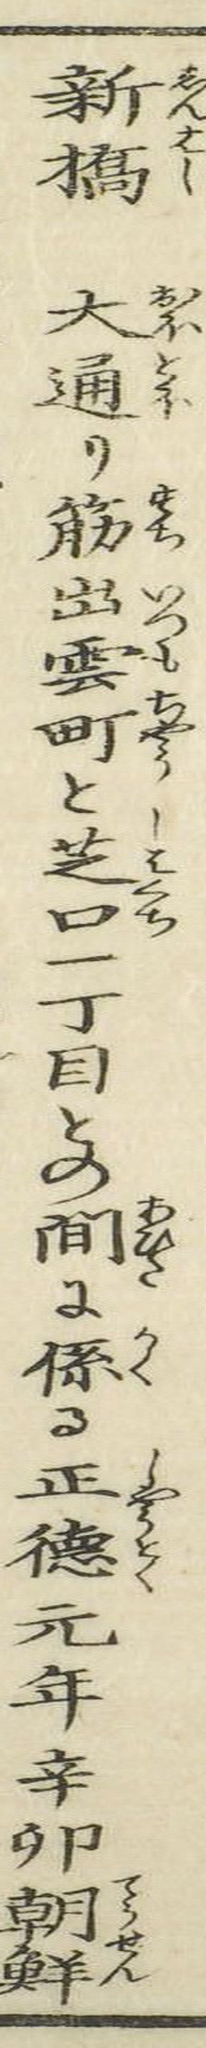新橋大通り筋出雲町と芝口一丁目との間に係る正徳元年辛卯朝鮮
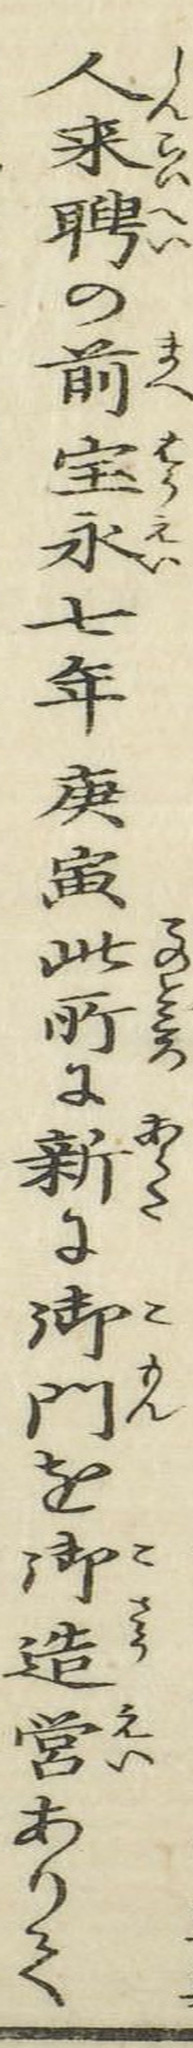人来聘の前宝永七年庚寅此所に新に御門を御造営ありて
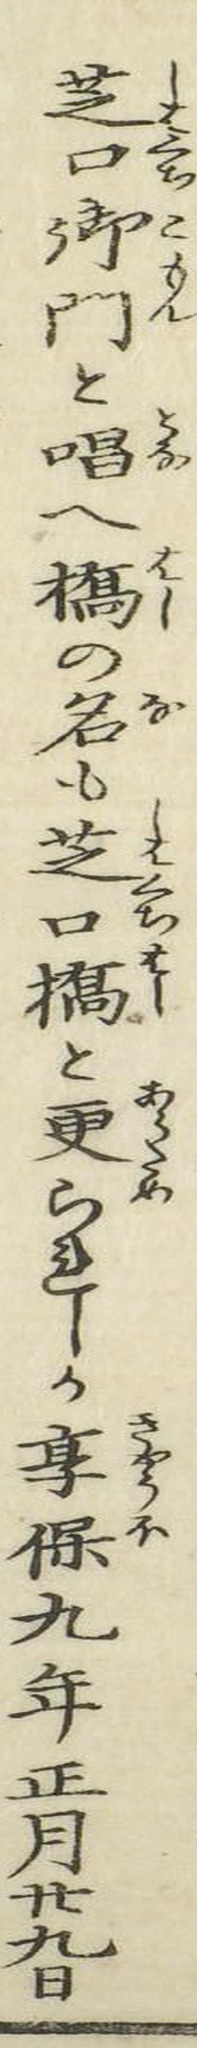芝口御門と唱へ橋の名も芝口橋と更られしか享保九年正月廿九日
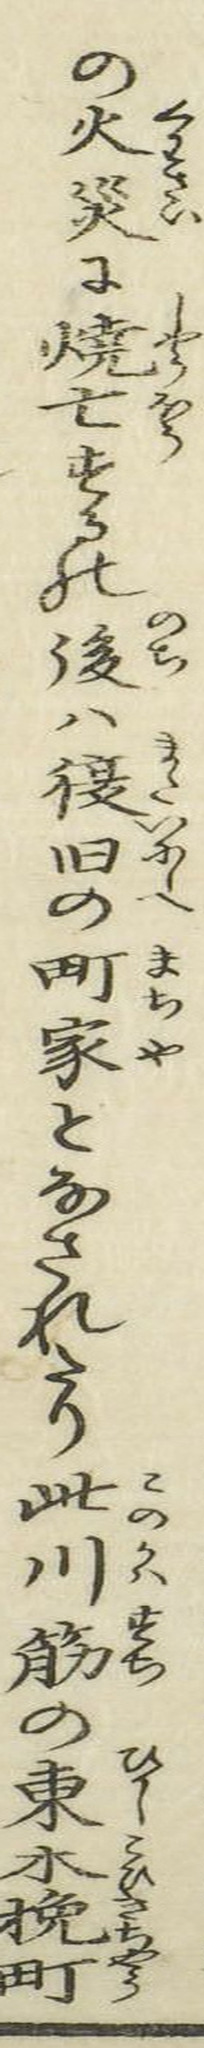の火災に焼亡するの後は復旧の町家となされたり此川筋の東木挽町
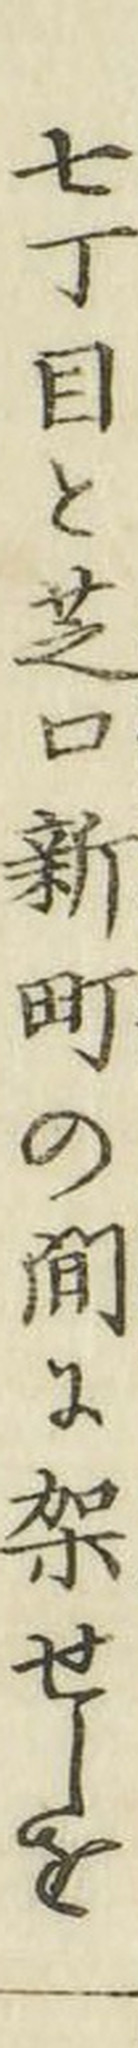七丁目と芝口新町の間に架せしを
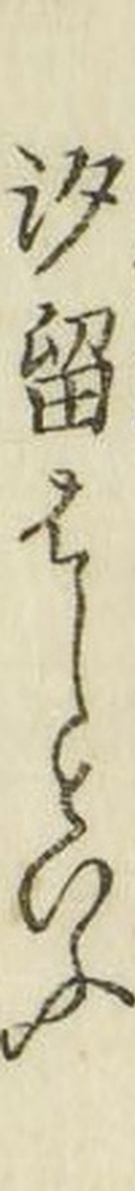汐留はしといふ
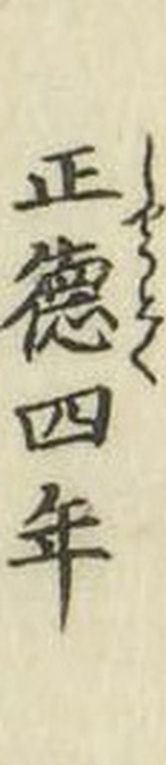正徳四年
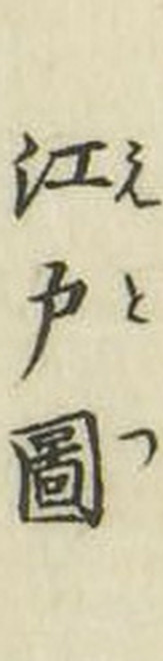江戸図

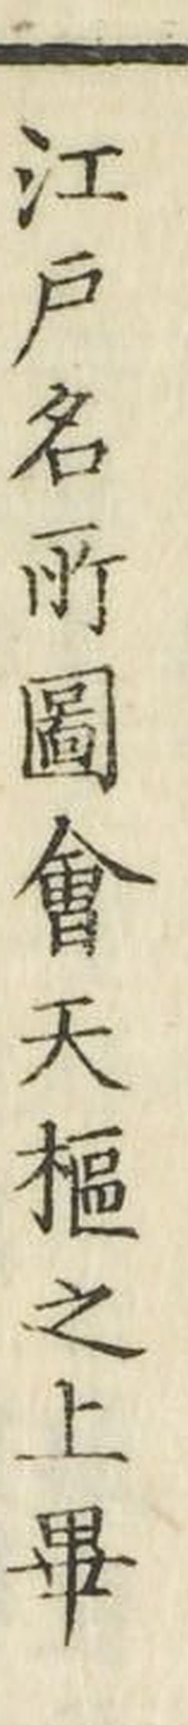江戸名所圖會天枢之上畢
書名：江戸名所図会 20巻 巻之2
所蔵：東京学芸大学教育コンテンツアーカイブ
